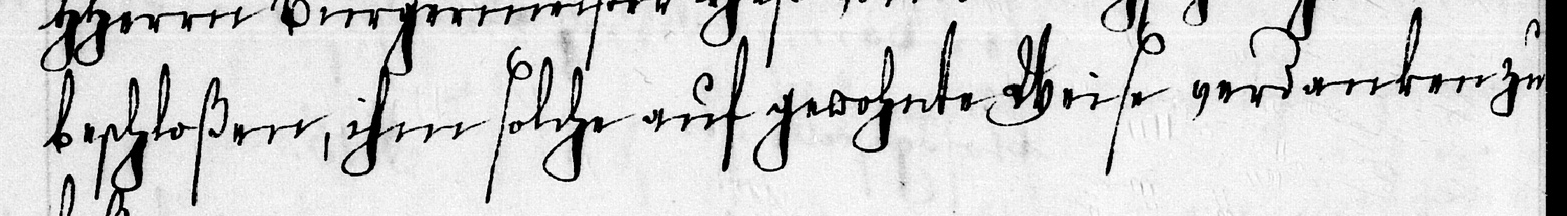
beschloßen, ihm solche auf gewohnte Weise verdanken zu
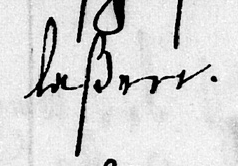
laßen.
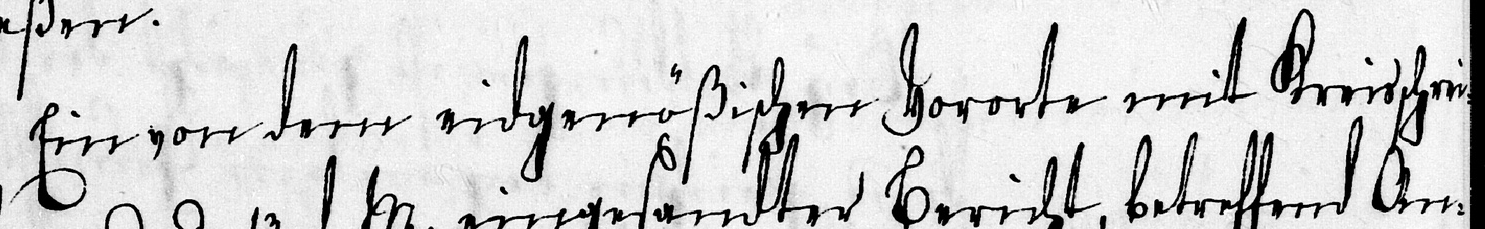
Ein von dem eidgenößischen Vororte mit Kreisschre¬
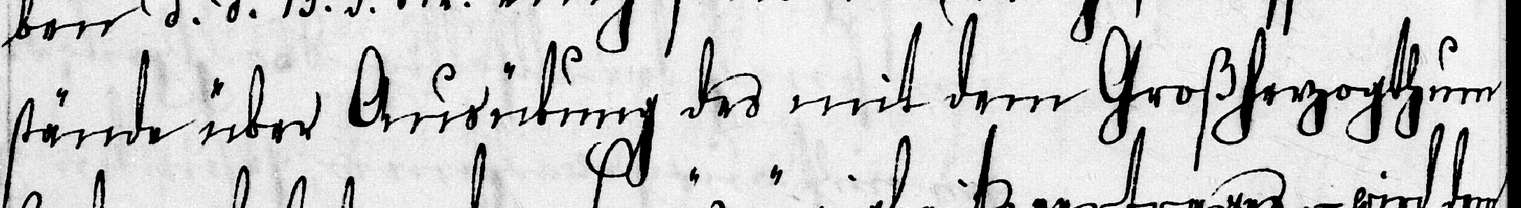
tände über Ausübung des mit dem Großherzogthum
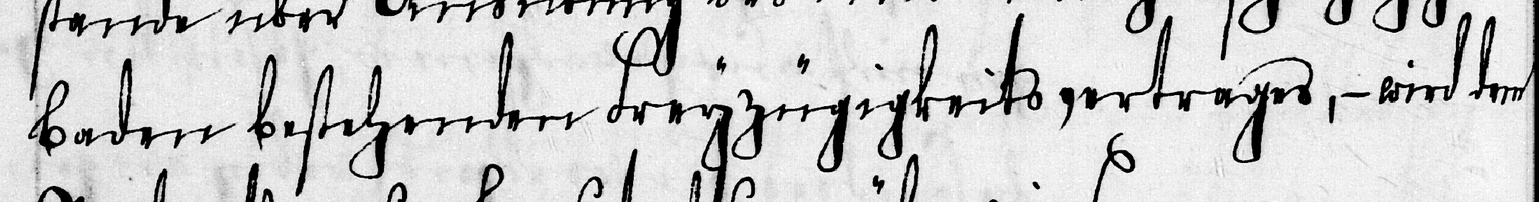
Baden bestehenden Freyzügigkeitsvertrages, – wird
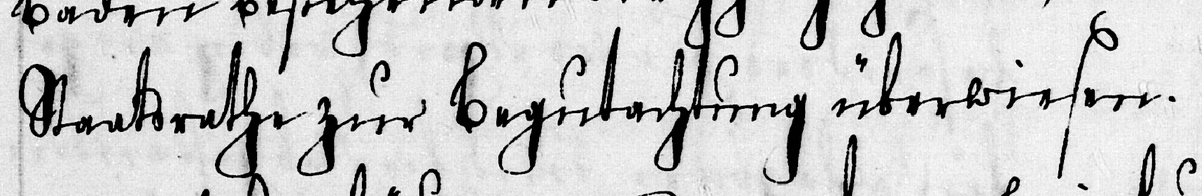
Staatsrathe zur Begutachtung überwiesen.
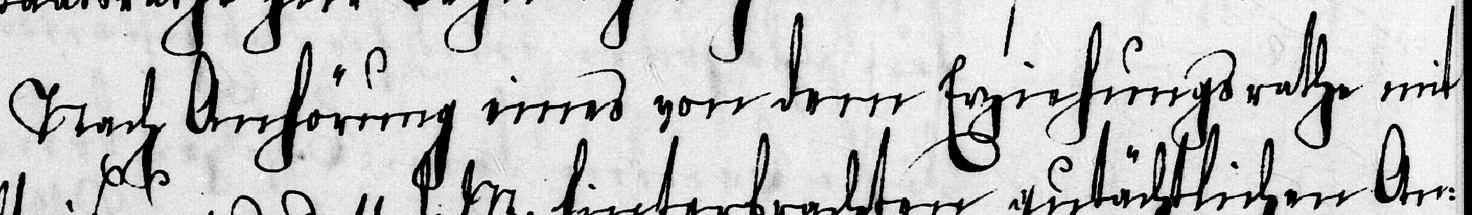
Nach Anhörung eines von dem Erziehungsrathe mit
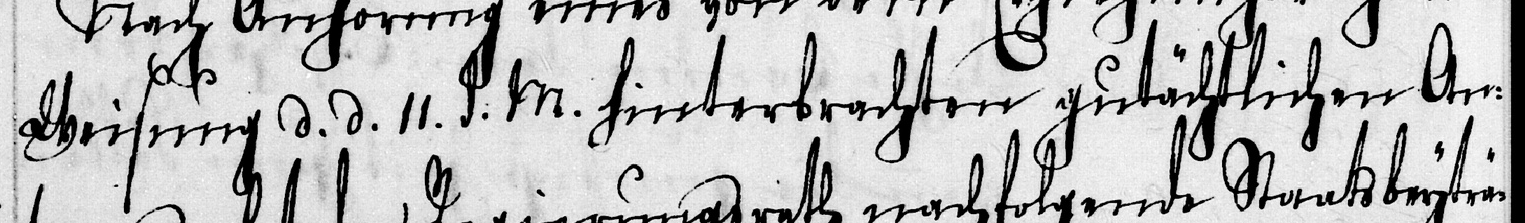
Weisung d. d. 11. d. M. hinterbrachten gutächtlichen An¬
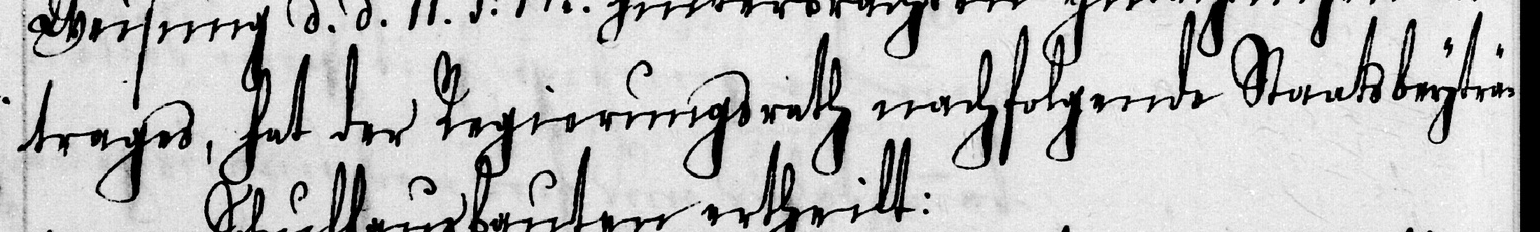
trages, hat der Regierungsrath nachfolgende Staatsbeytr¬
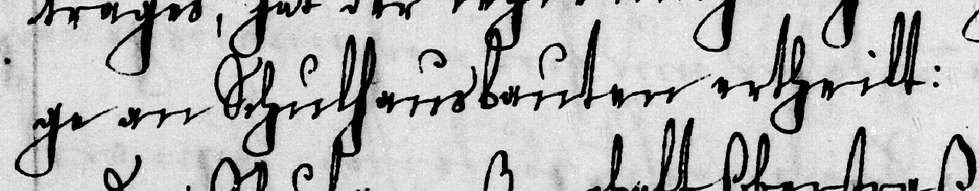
äge an Schulhausbauten ertheilt.
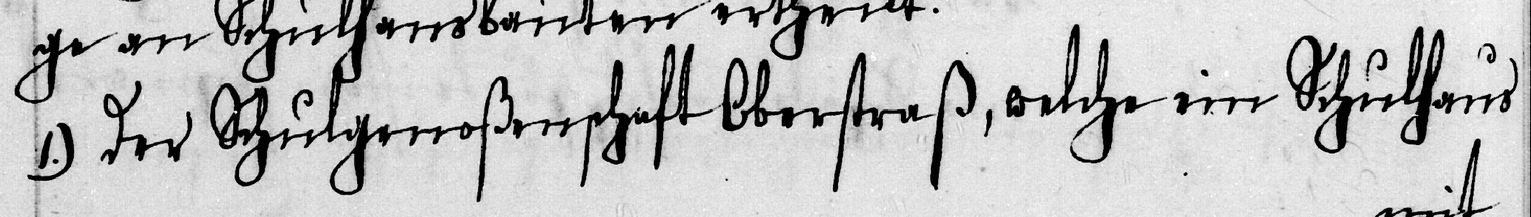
1.) Der Schulgenoßenschaft Oberstraß, welche ein Schulhaus
